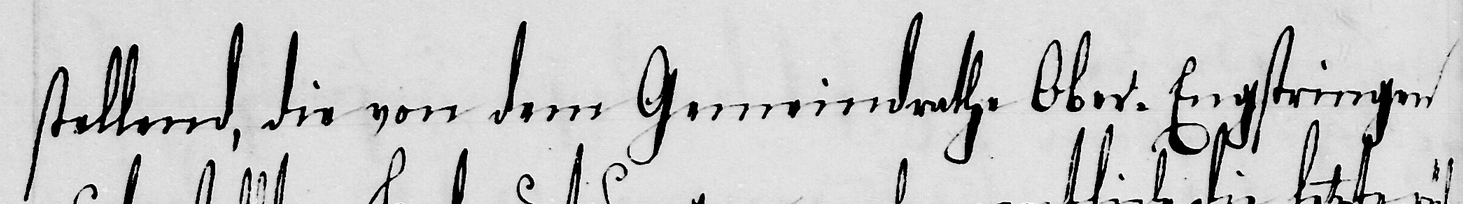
stellend, die von dem Gemeindrathe Ober-Engstringen
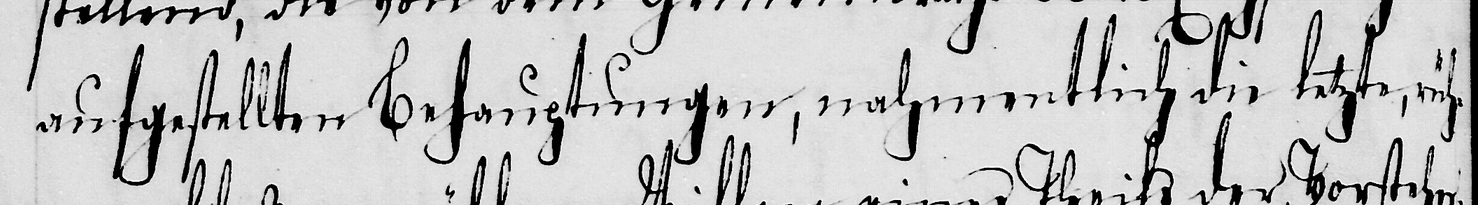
aufgestellten Behauptungen, nahmentlich die letzte, r¬
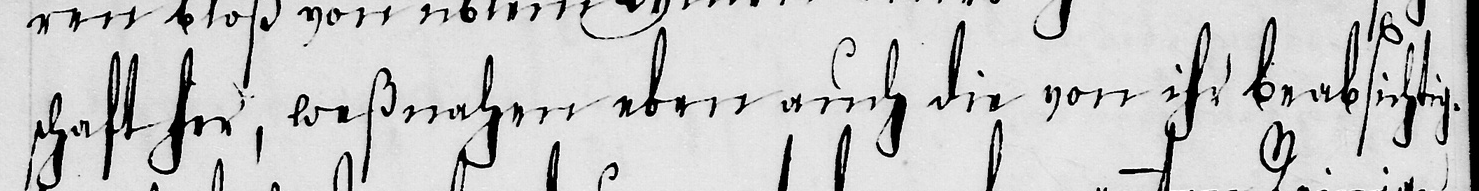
schaft her, weßnahen eben auch die von ihr beabsich¬
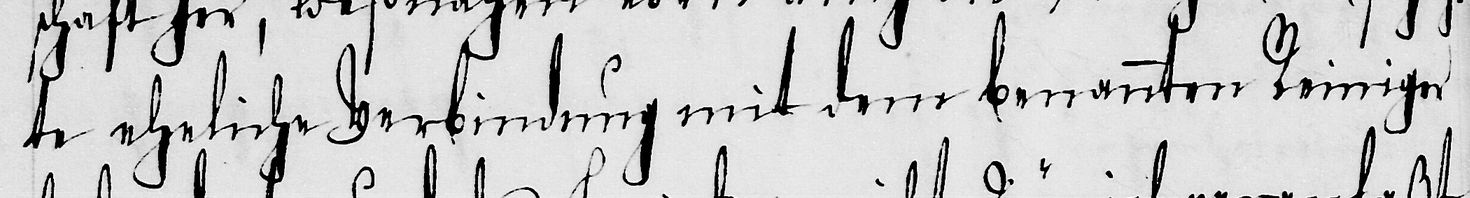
te eheliche Verbindung mit dem benannten Reiniger
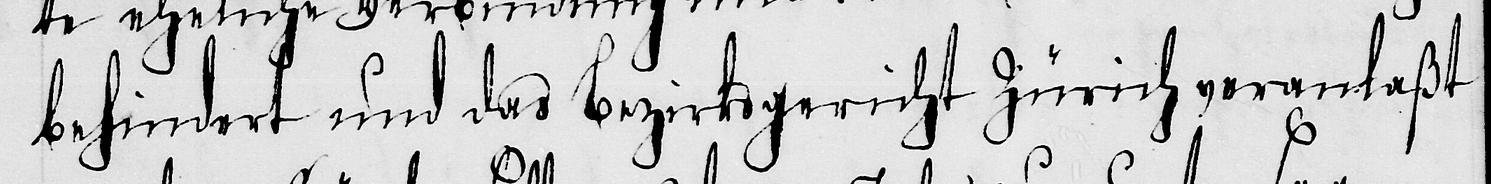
behindert und das Bezirksgericht Zürich veranlaßt
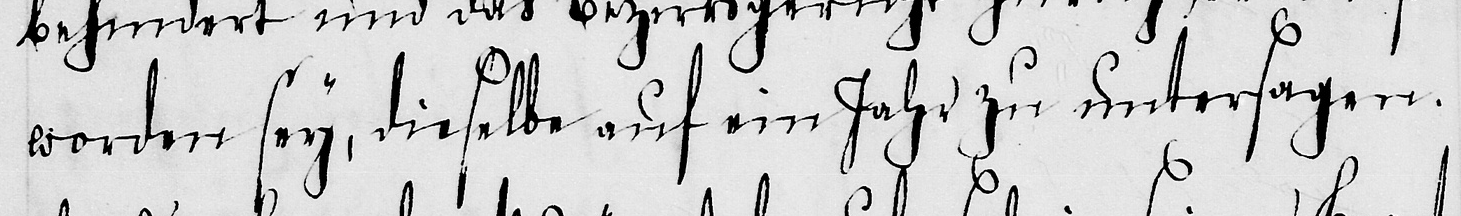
worden sey, dieselbe auf ein Jahr zu untersagen.
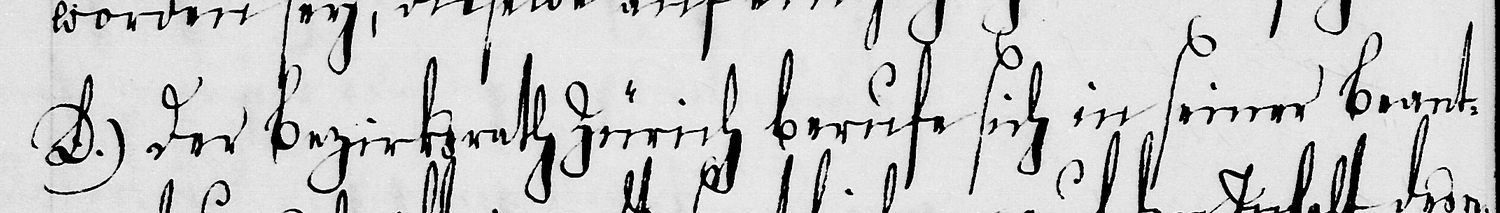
D.) Der Bezirksrath Zürich berufe sich in seiner Beant¬
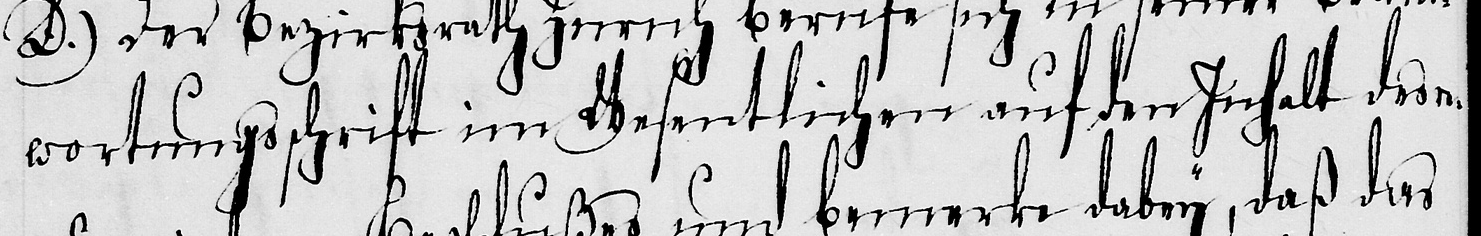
wortungsschrift im Wesentlichen auf den Inhalt des
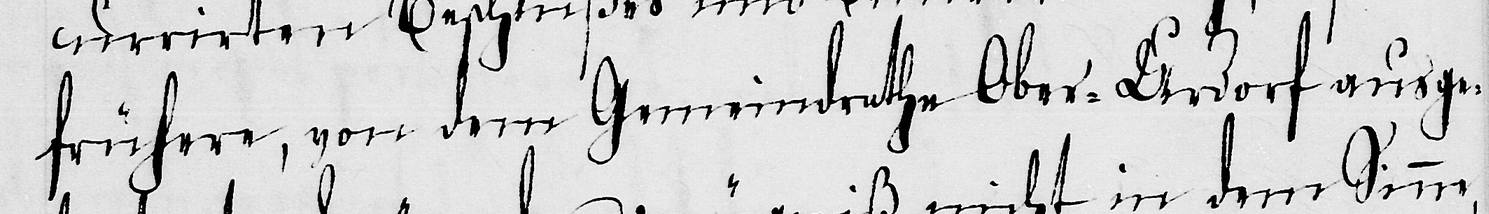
frühere, von dem Gemeindrathe Ober-Urdorf ausge¬
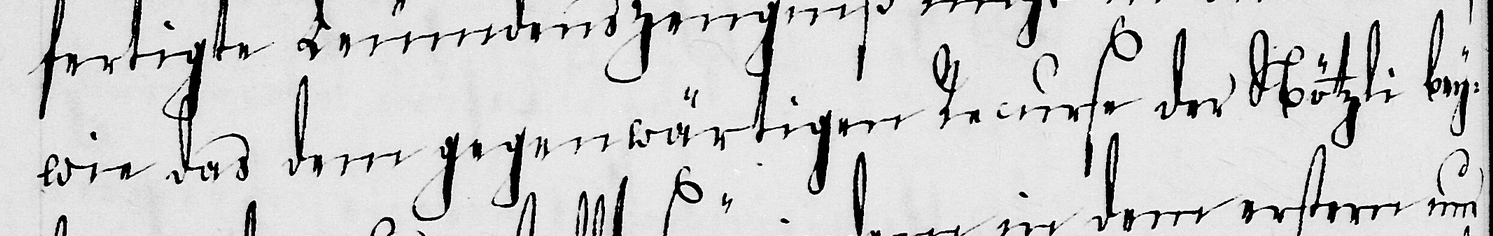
wie das dem gegenwärtigen Recurse der Nötzli be¬
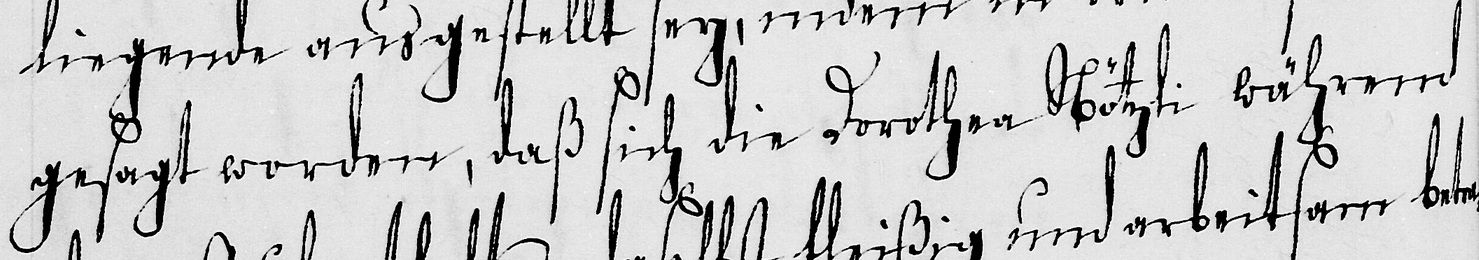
gesagt worden, daß sich die Dorothea Nötzli während
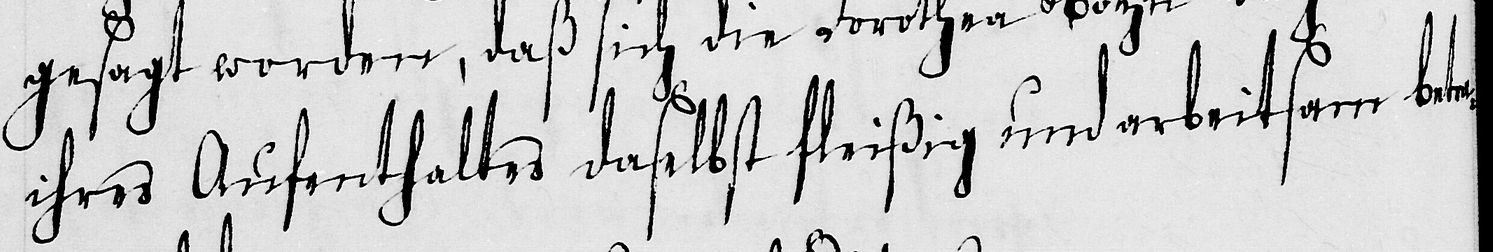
ihres Aufenthaltes daselbst fleißig und arbeitsam betr¬
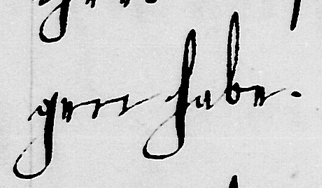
agen habe.
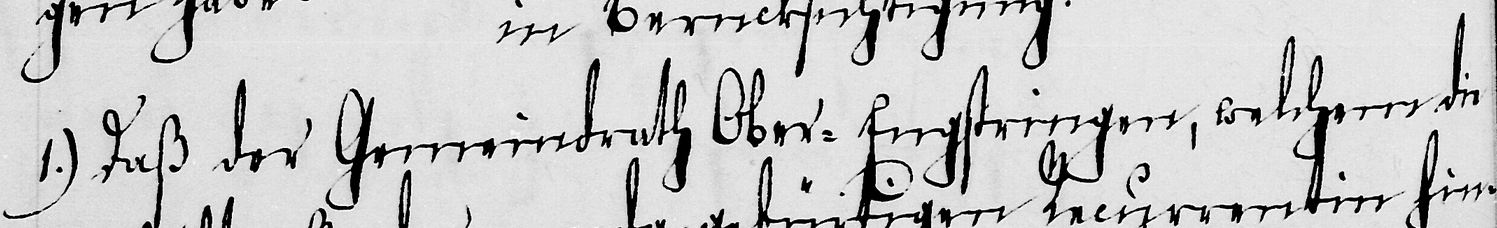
1.) Daß der Gemeindrath Ober-Engstringen, welchem die
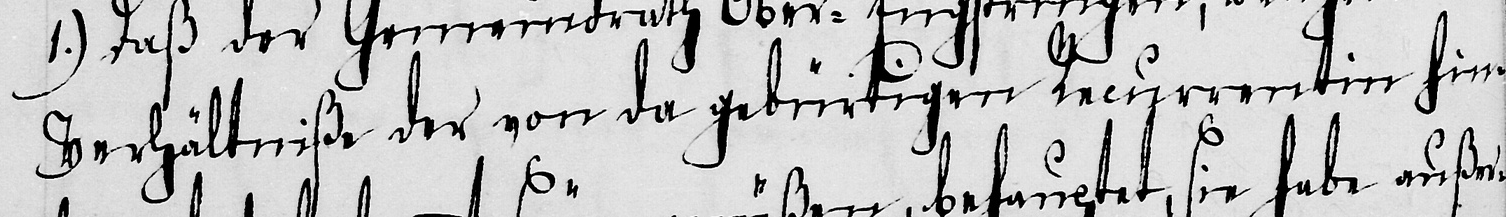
Verhältniße der von da gebürtigen Recurrentin hin¬
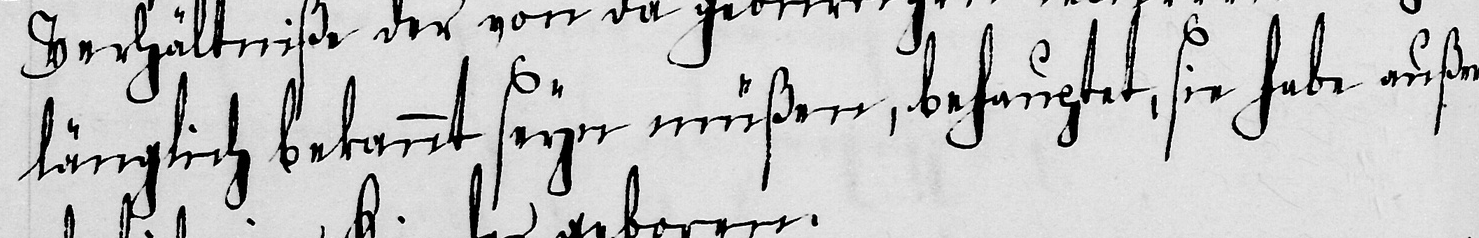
länglich bekannt seyn müßen, behauptet, sie habe au¬
